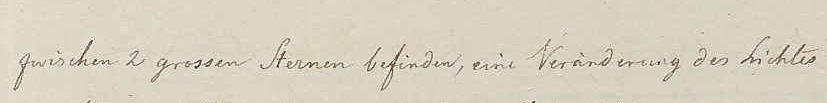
zwischen 2 grossen Sternen befinden, eine Veränderung des Lichtes
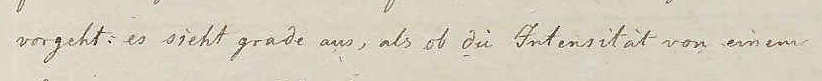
vorgeht: es sieht grade aus, als ob die Intensität von einem
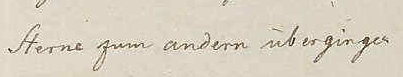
Sterne zum andern überginge.
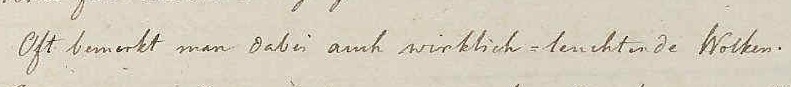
Oft bemerkt man dabei auch wirklich-leuchtende Wolken.
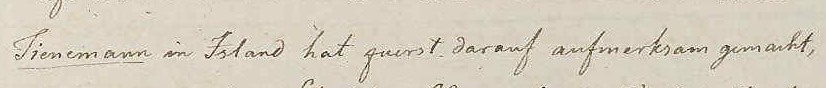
Tienemann in Island hat zuerst darauf aufmerksam gemacht,
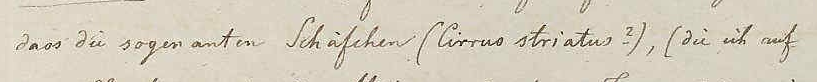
dass die sogenanten Schäfchen , mit dem Nordlicht in Verbindung stehn
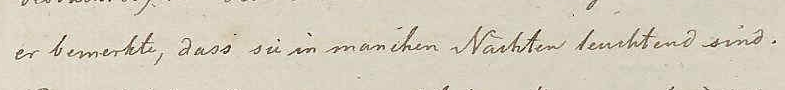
er bemerkte, dass sie in manchen Nächten leuchtend sind.
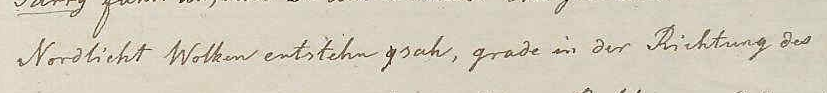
Nordlicht Wolken entstehn gsah, grade in der Richtung des
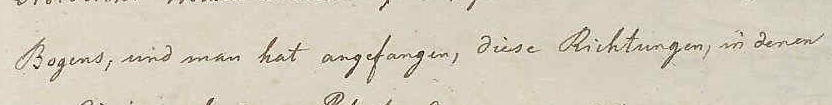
Bogens, und man hat angefangen, diese Richtungen, in denen
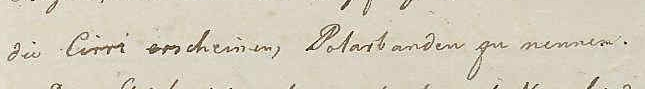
die Cirri erscheinen, Polarbanden zu nennen.
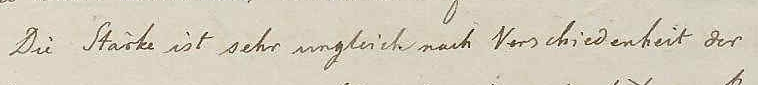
Die Stärke ist sehr ungleich nach Verschiedenheit der
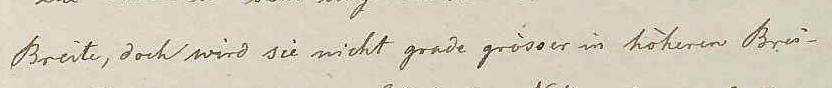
Breite, doch wird sie nicht grade grösser in höheren Brei-
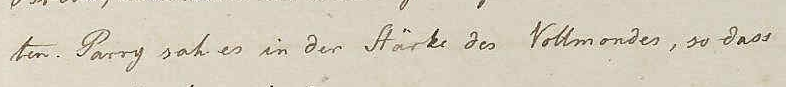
ten. Parry sah es in der Stärke des Vollmondes, so dass
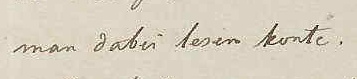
man dabei lesen konte.
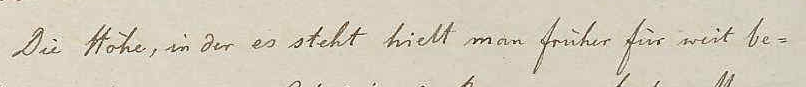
Die Höhe, in der es steht hielt man früher für weit be-
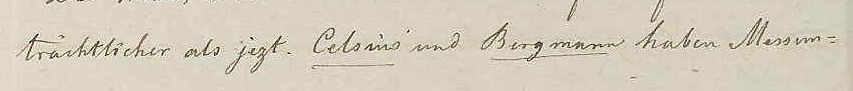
trächtlicher als jezt. Celsius und Bergmann haben Messun-
